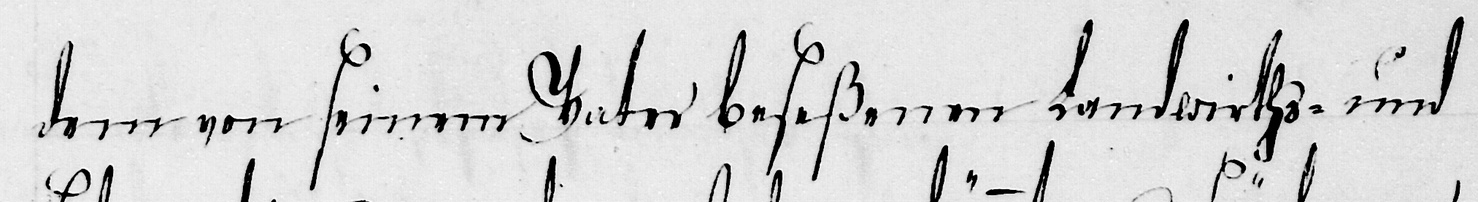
dem von seinem Vater beseßenen Landwirths- und
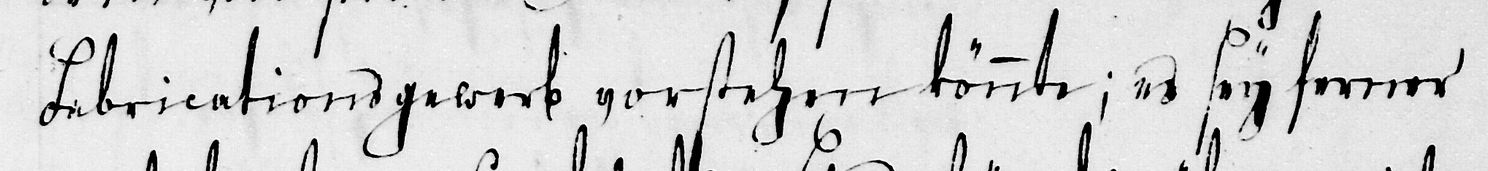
Fabricationsgewerb vorstehen könnte; es sey ferner
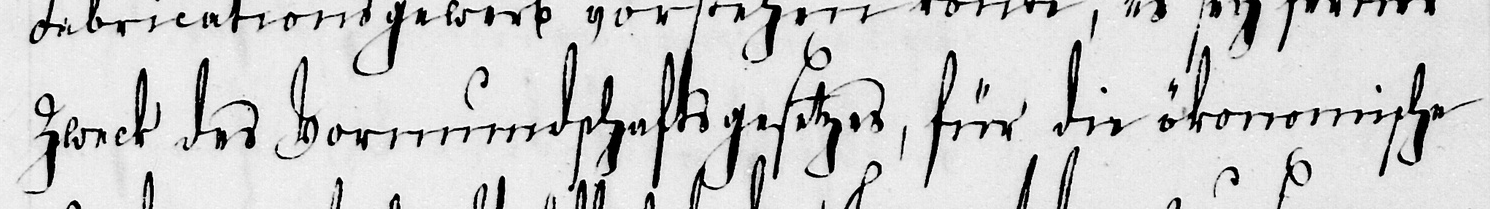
Zweck des Vormundschaftsgesetzes, für die ökonomische
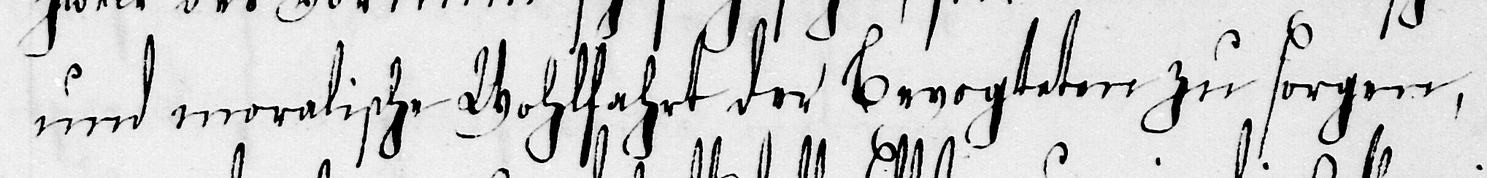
und moralische Wohlfahrt der Bevogteten zu sorgen,
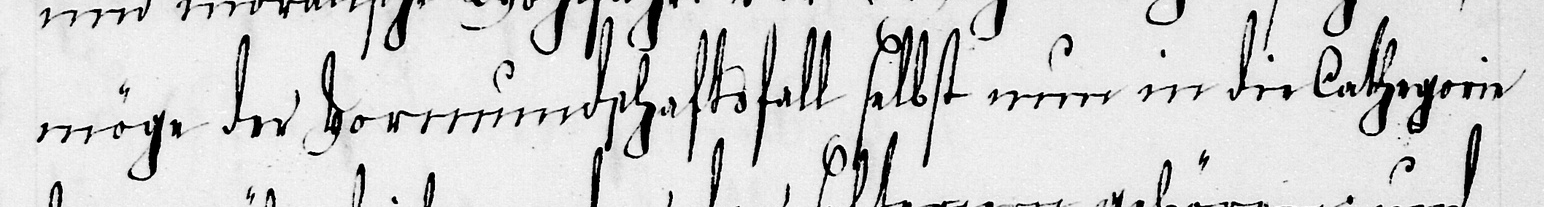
möge der Vormundschaftsfall selbst nun in die Cathegorie
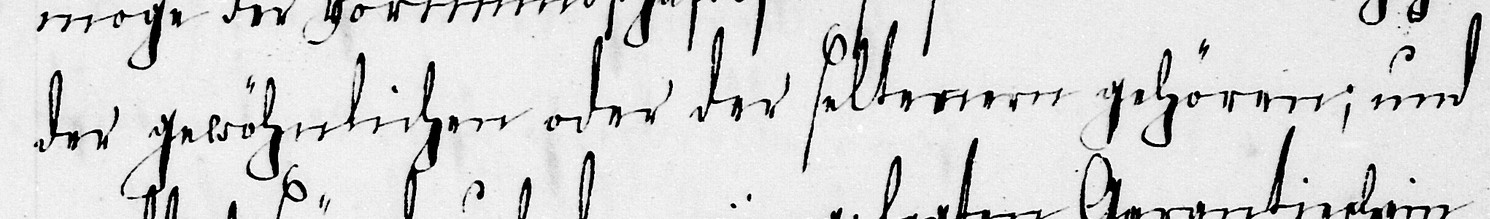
der gewöhnlichen oder der seltenern gehören; und
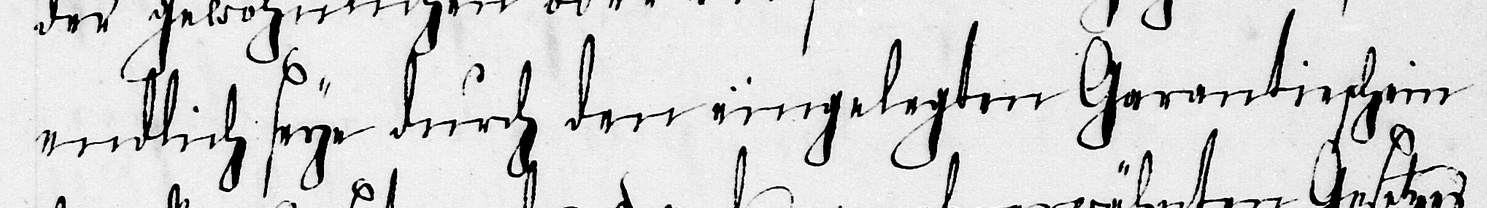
endlich seye durch den eingelegten Garantieschein
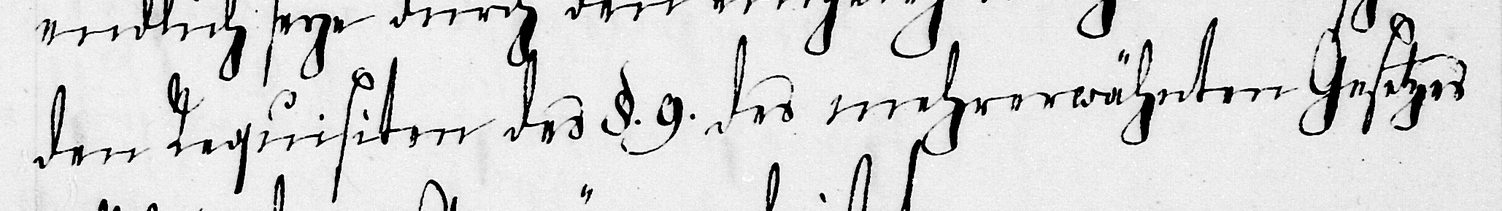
den Requisiten des §. 9. des mehrerwähnten Gesetzes
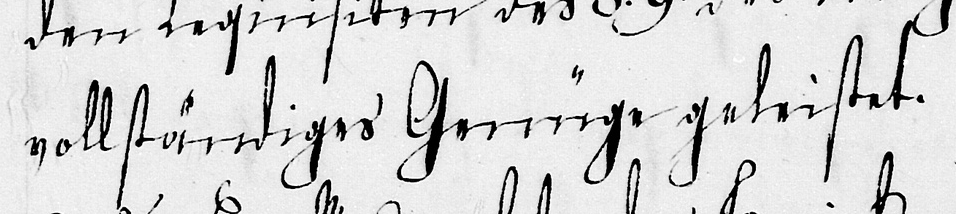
vollständiges Genüge geleistet.
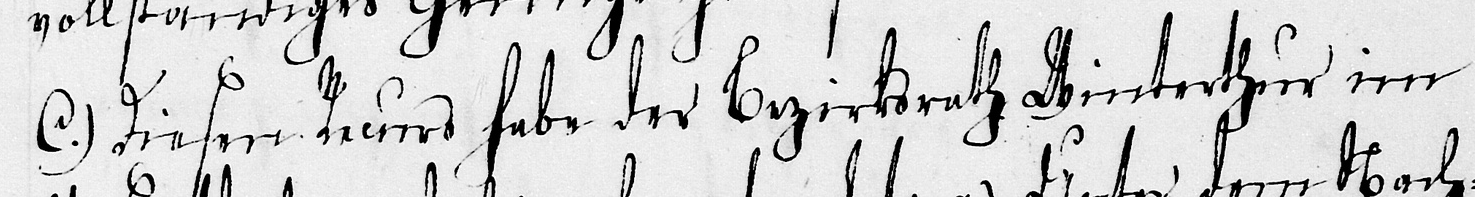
C.) Diesen Recurs habe der Bezirksrath Winterthur im
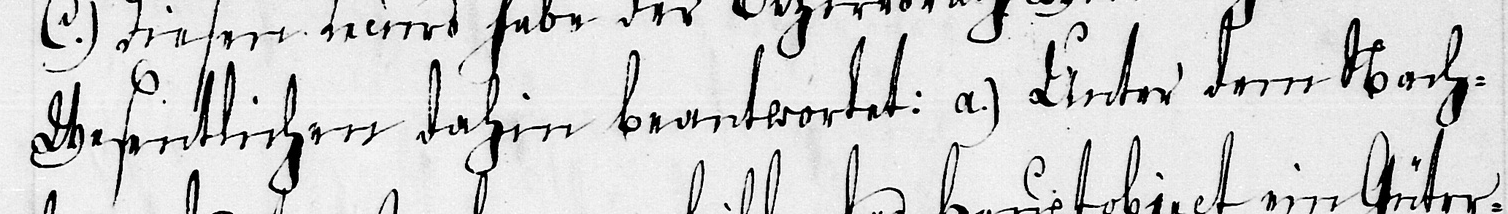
Wesentlichen dahin beantwortet: a.) Unter dem Nach¬
